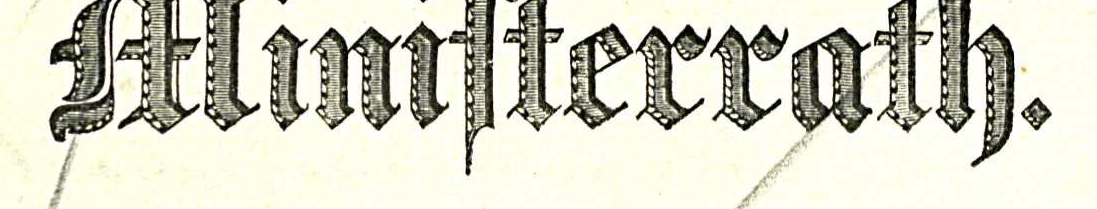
Ministerrath
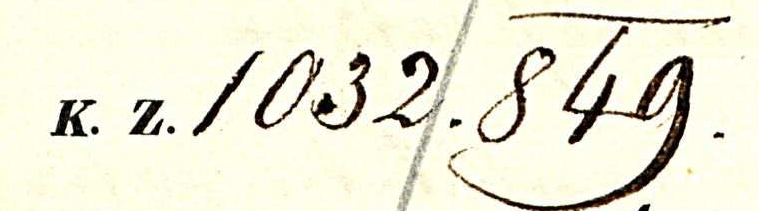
KZ 1032.849
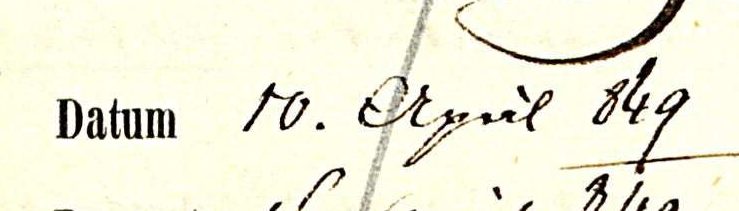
Datum 10. April 849
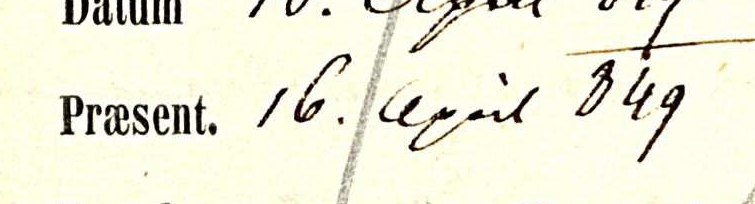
Praesent. 16. April 849
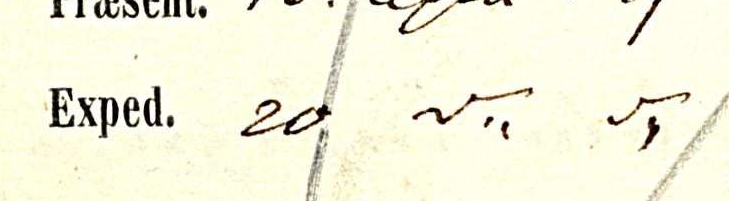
Exped. 20 „ „
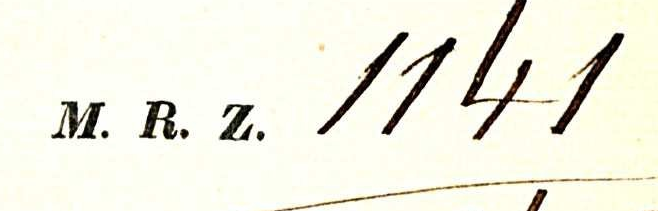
M.R. Z. 1141
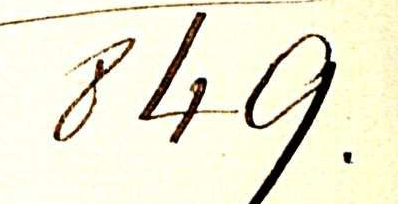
849
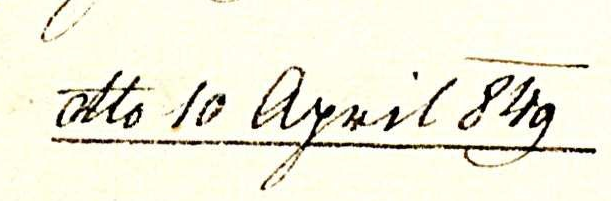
d.d. 10. April 1849
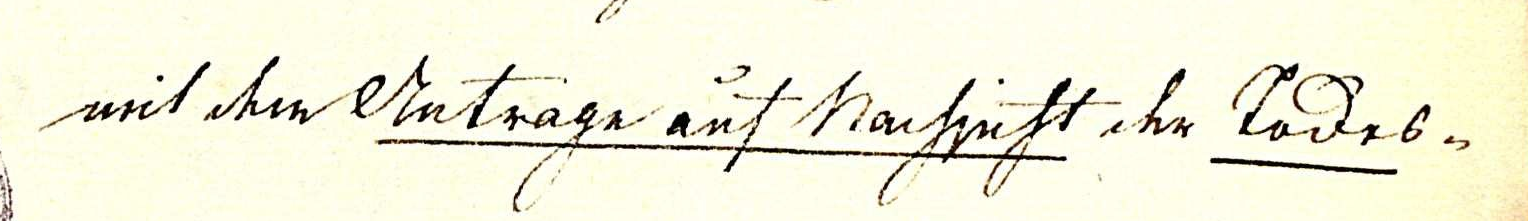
mit dem Antrag auf Nachsicht der Todes¬
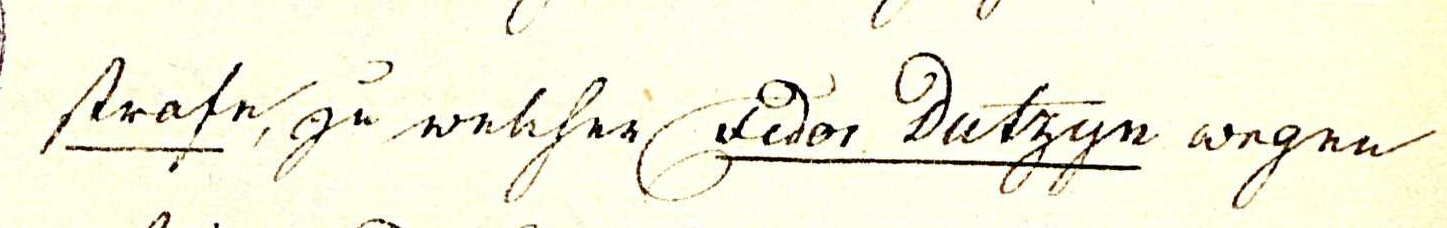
strafe zu welcher Fedor Dutzyn wegen
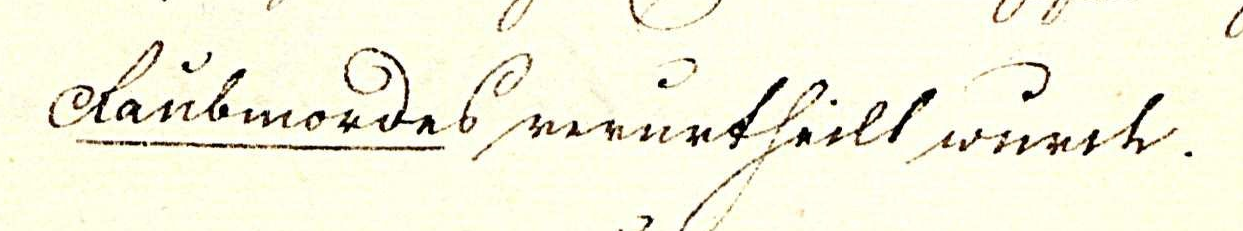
Raubmordes verurtheilt wurde.
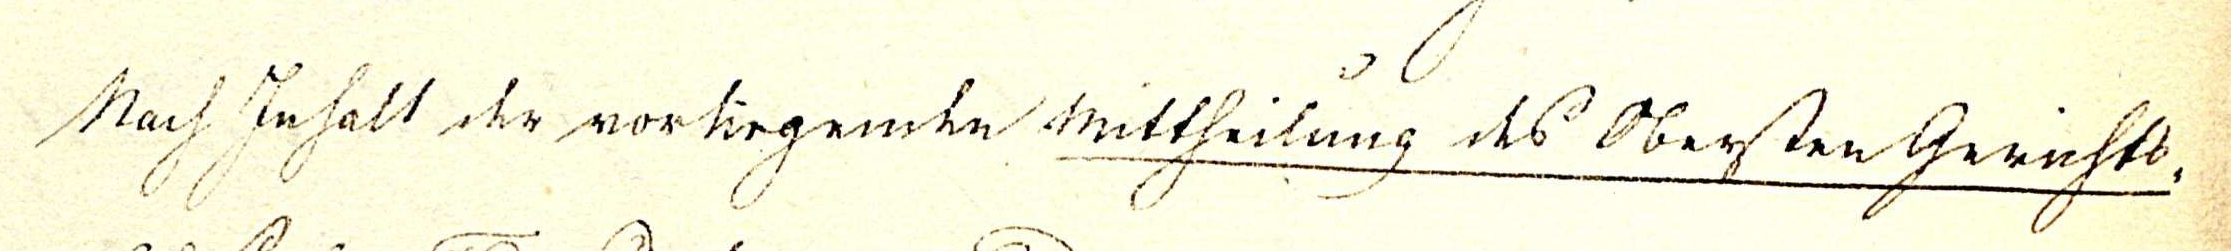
Nach Inhalt der vorliegende Mittheilung des Oberste Gerichts¬
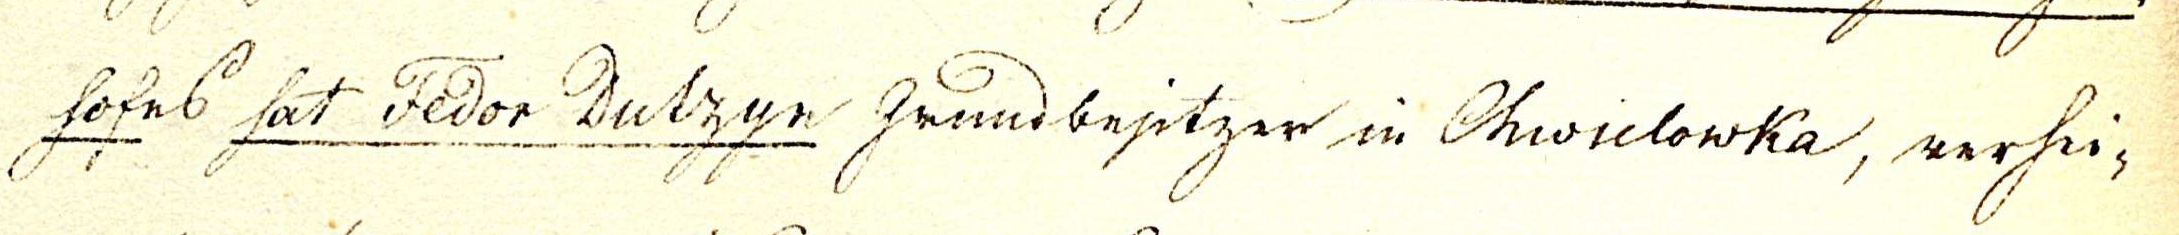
hofes hat Fedor Dutzyn Grundbesitzer in Chwiclowka, verhei¬
